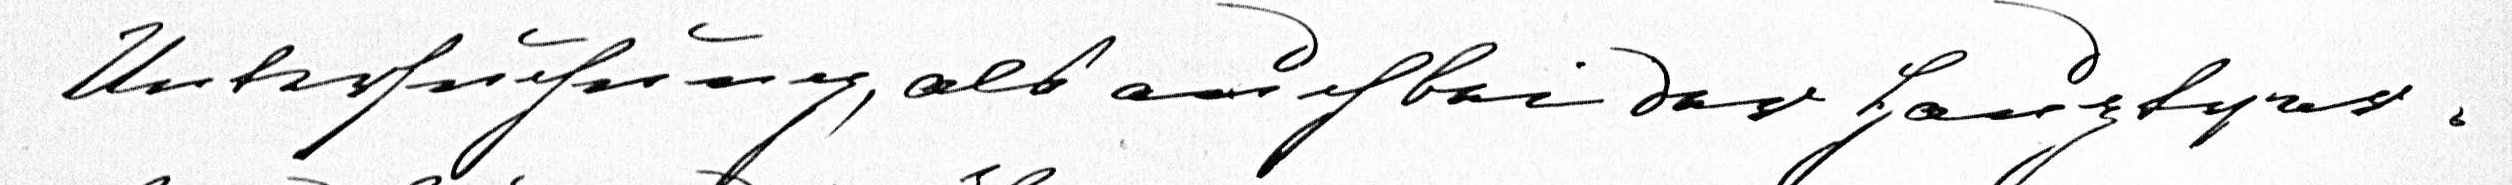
Untersuchung, als auf bei der Hauptver¬
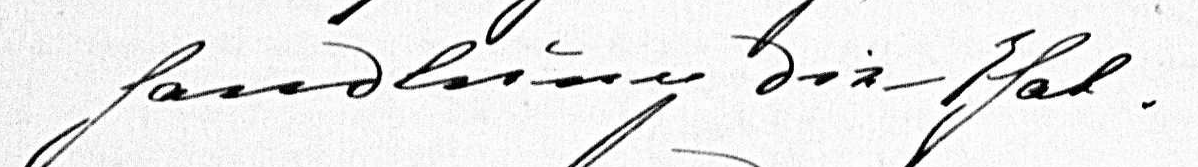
handlung die That.
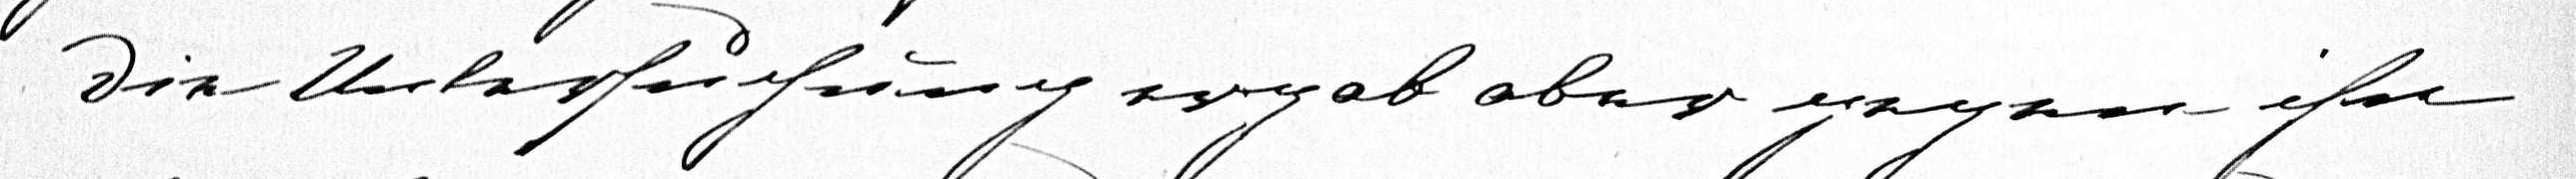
Die Untersuchung ergab aber gegen ihn
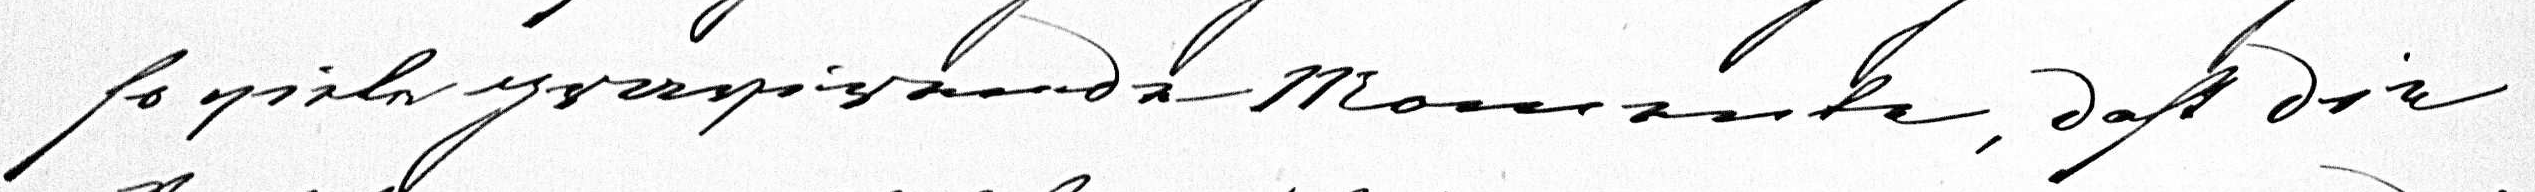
so viele granvierende Momente, daß die
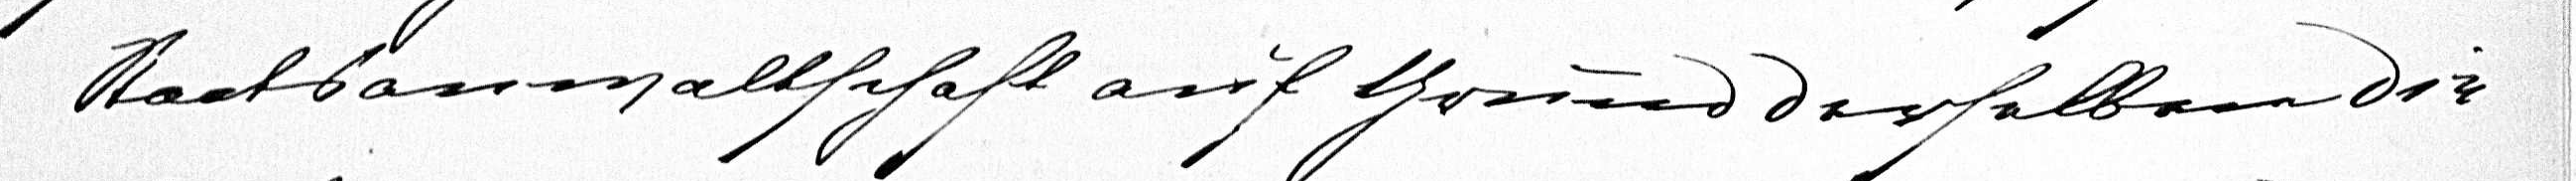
Staatsanwahlschaft auf Grund derselben die
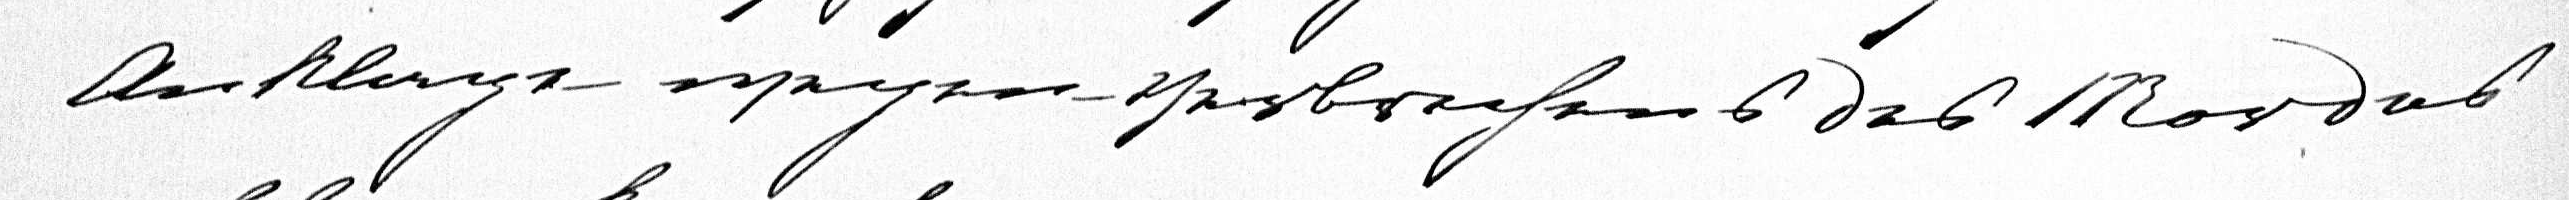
Anklage wegen Verbrechens des Mordes
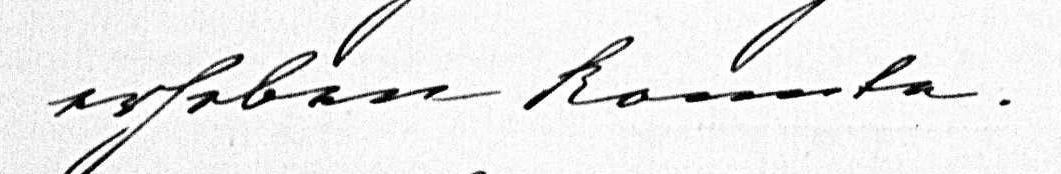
erheben konnte.
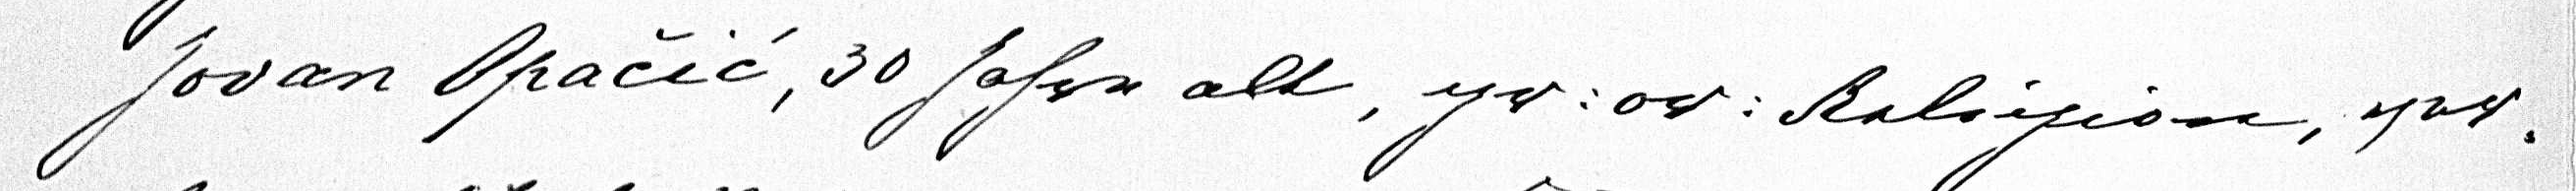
Jovan Opačić, 30 Jahre alt, gr: or: Religion, ver¬
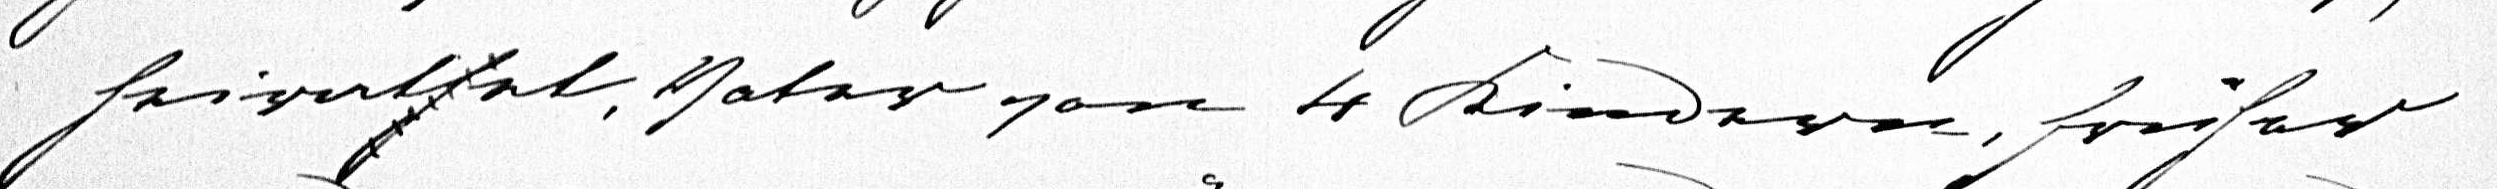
heiratet, Vater von 4 Kindern, früher
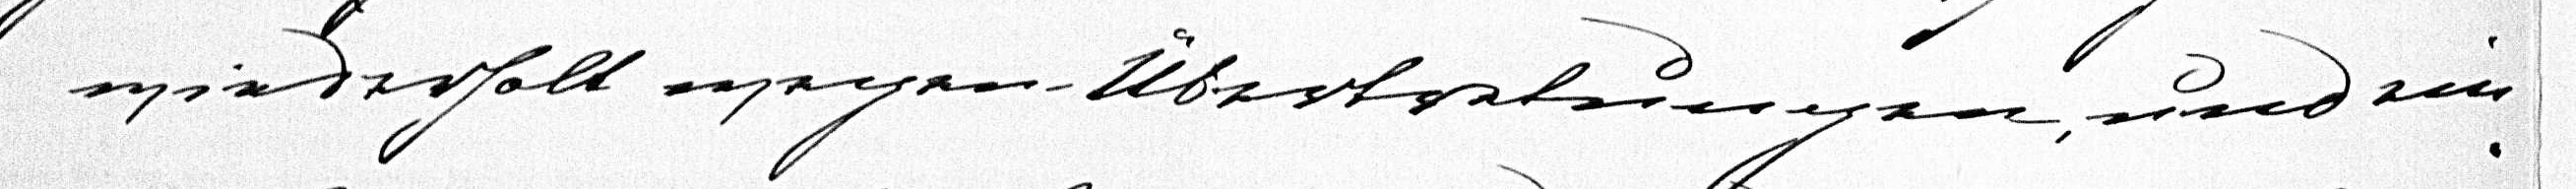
wiederholt wegen Übertretungen, und ein¬
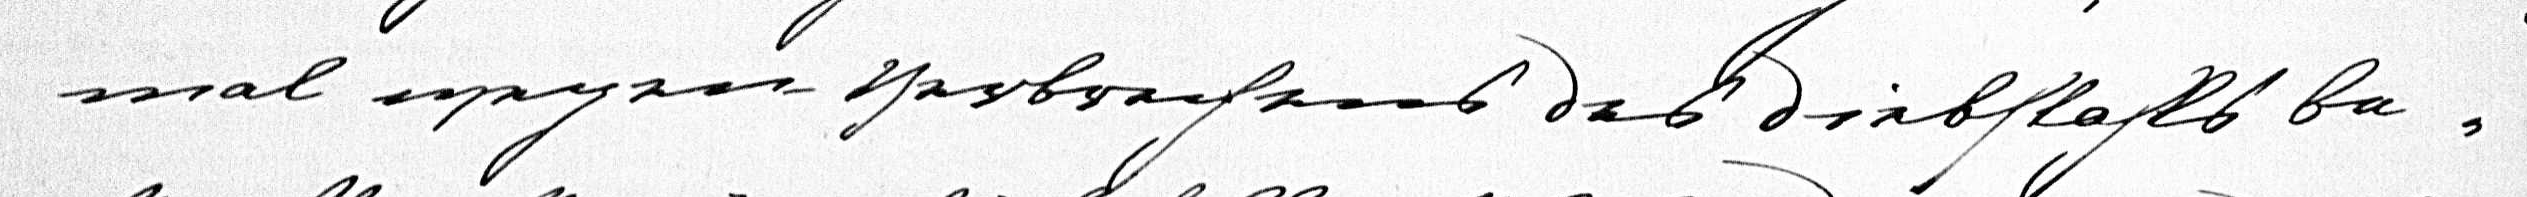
mal wegen Verbrechens des diebstahls be¬
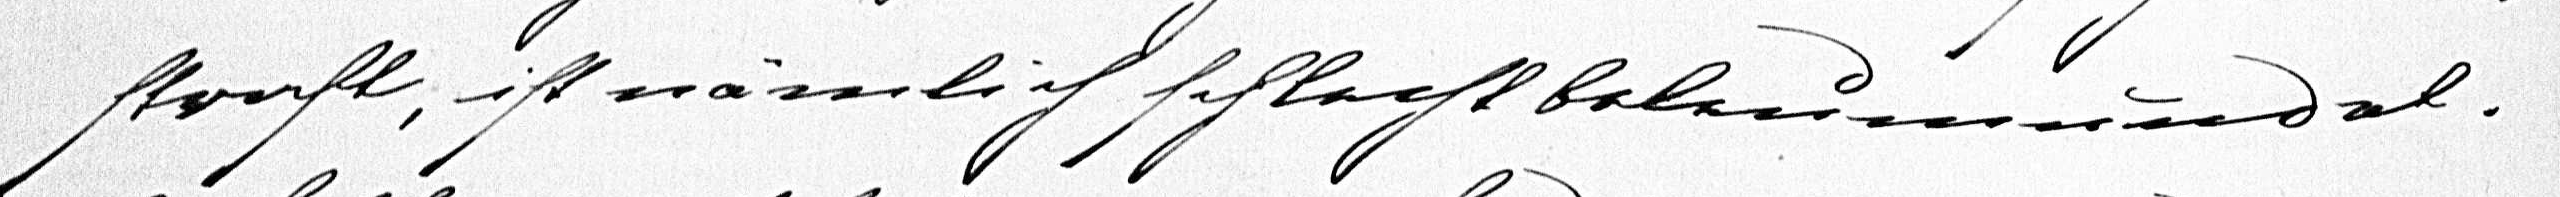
straft, ist nämlich schlacht beleumundet.
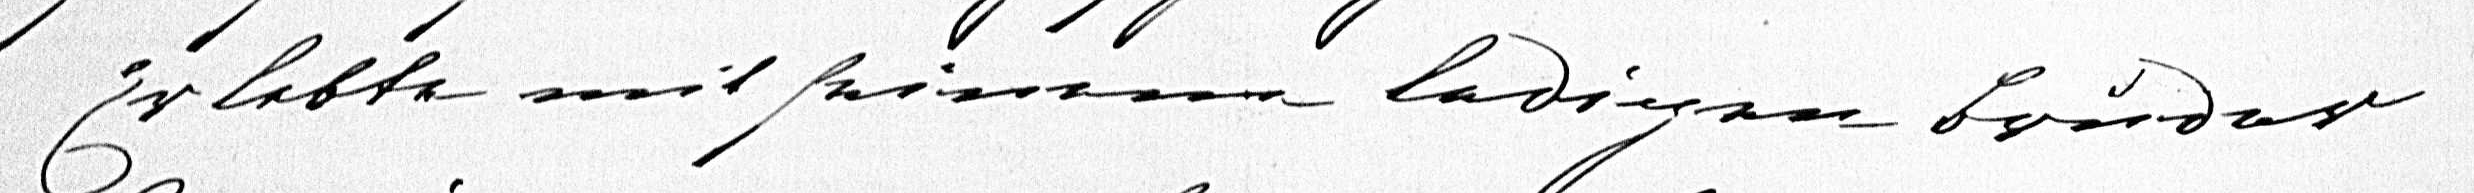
Er lebte mit seinem ledigen Bruder
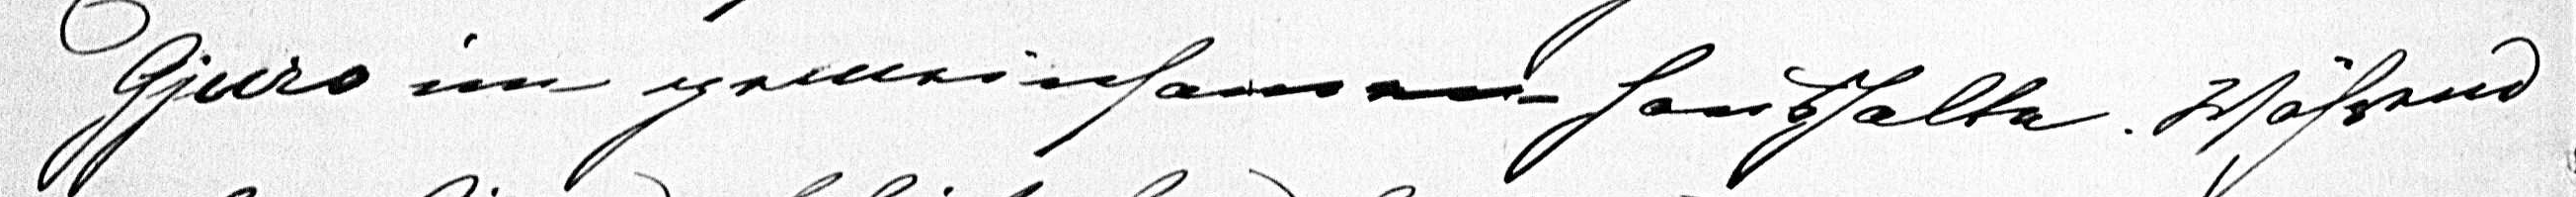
Gjuro im gemeinsamen haushalte. Während
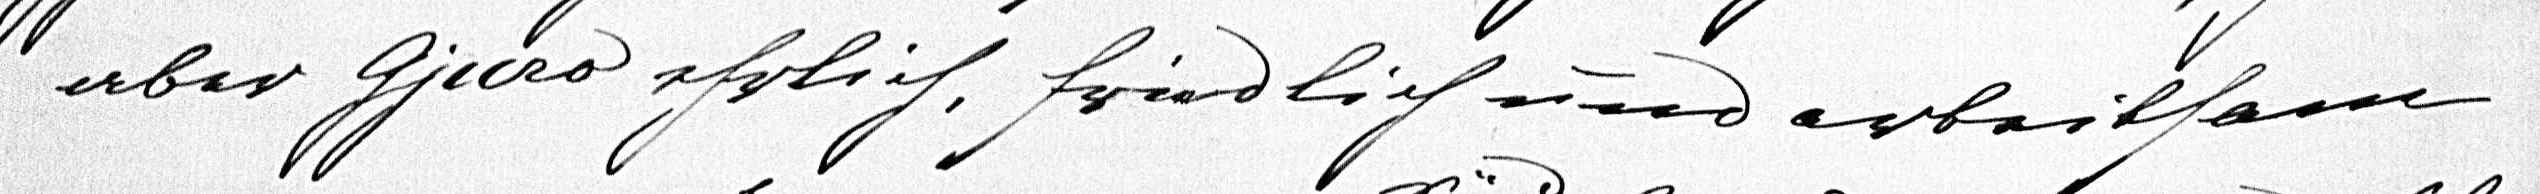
aber Gjuro ehrlich, friedlich und arbeitsam
